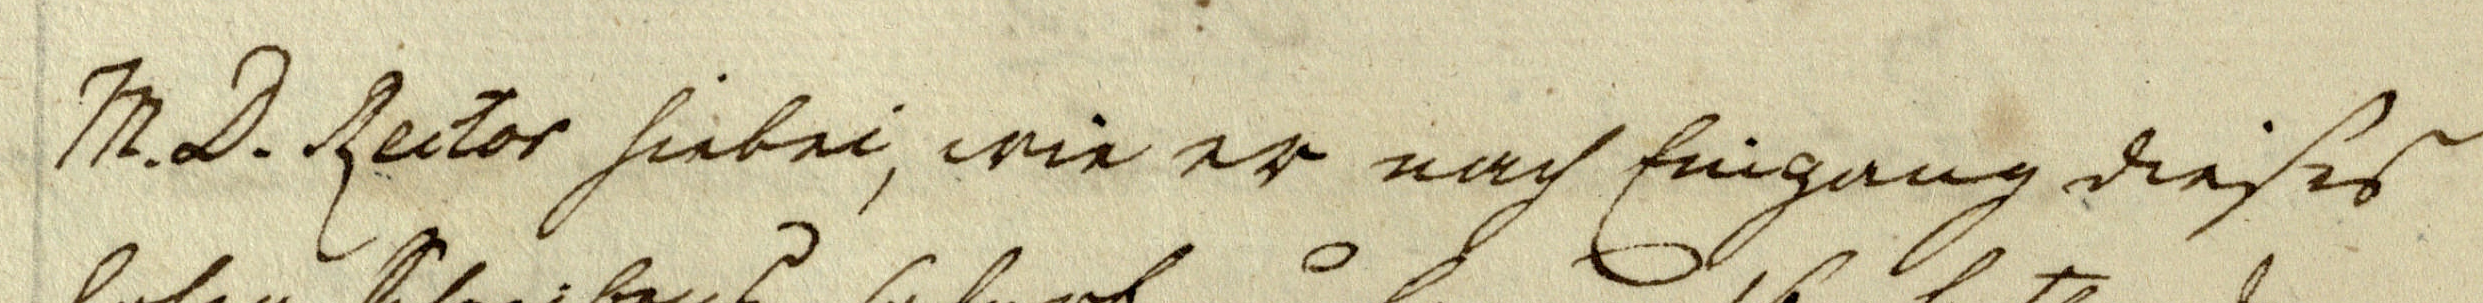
M. D. Rector hiebei, wie er nach Eingang dieses
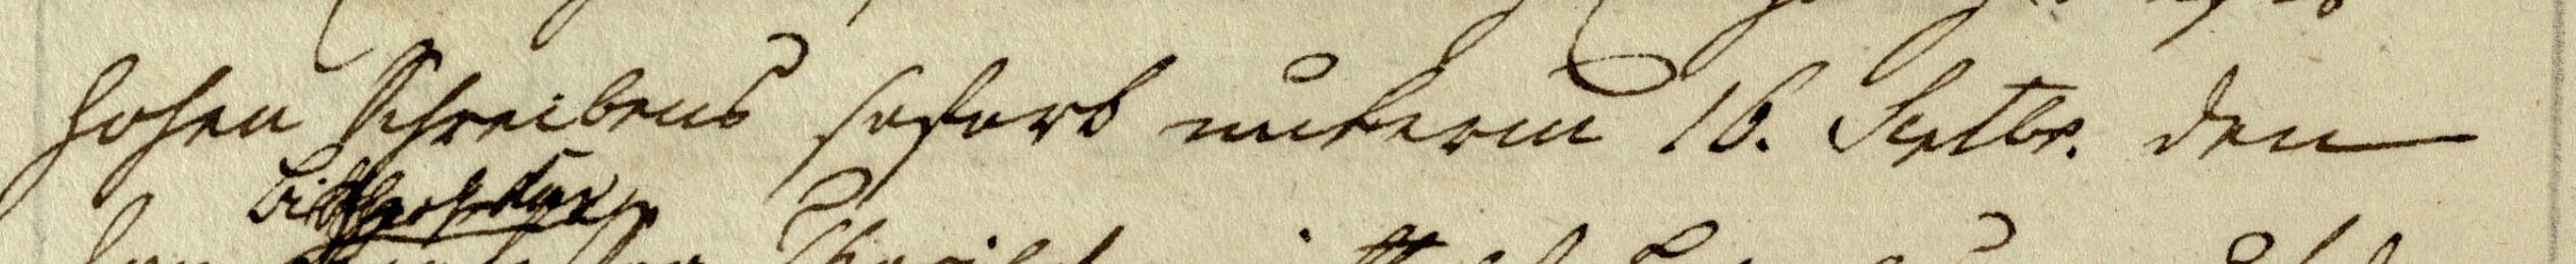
hohen Schreibens sofort unterm 16. Septbr. den
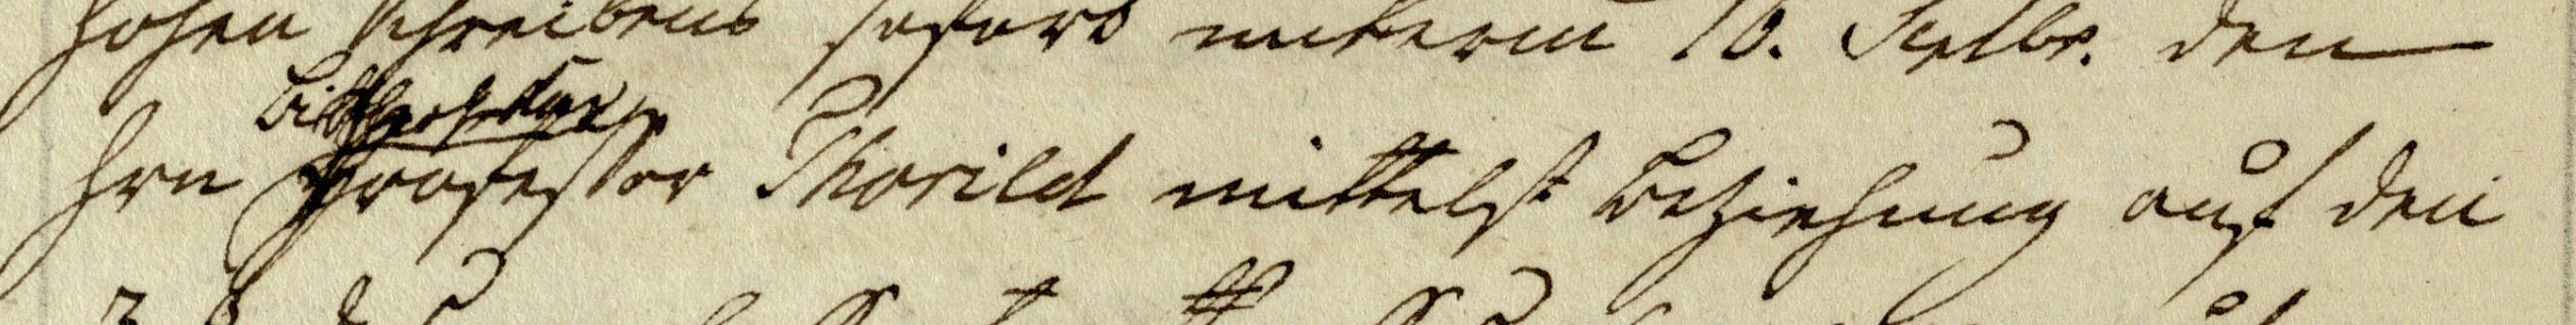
hrn Bibliothekar Professor Thorild mittelst Beziehung auf den
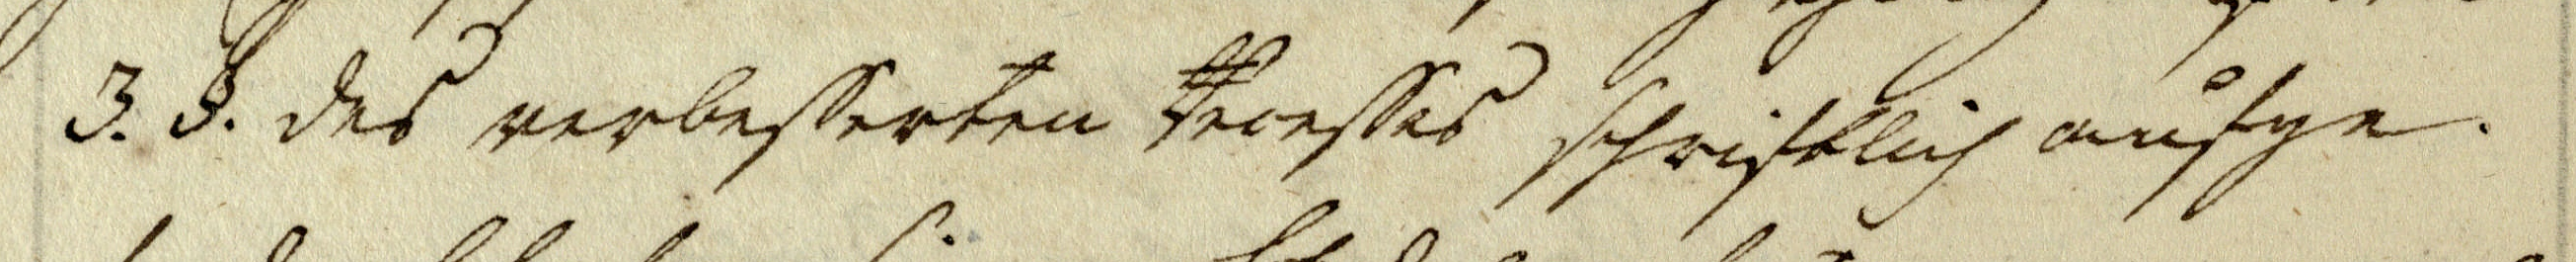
3. §. des verbesserten Recesses schriftlich aufge¬
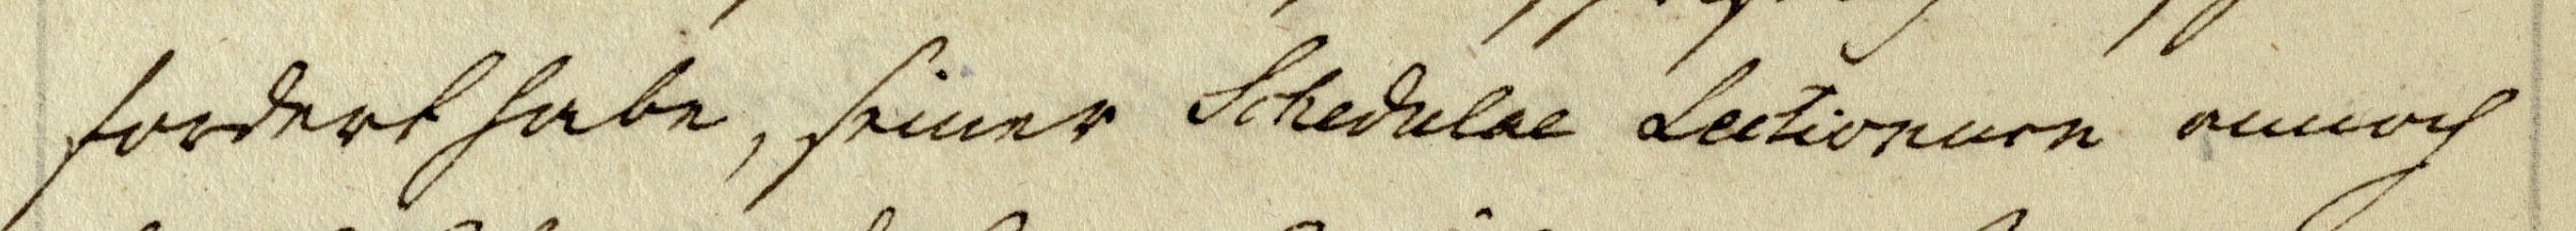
fordert habe, seiner Schedulae Lectionum annoch
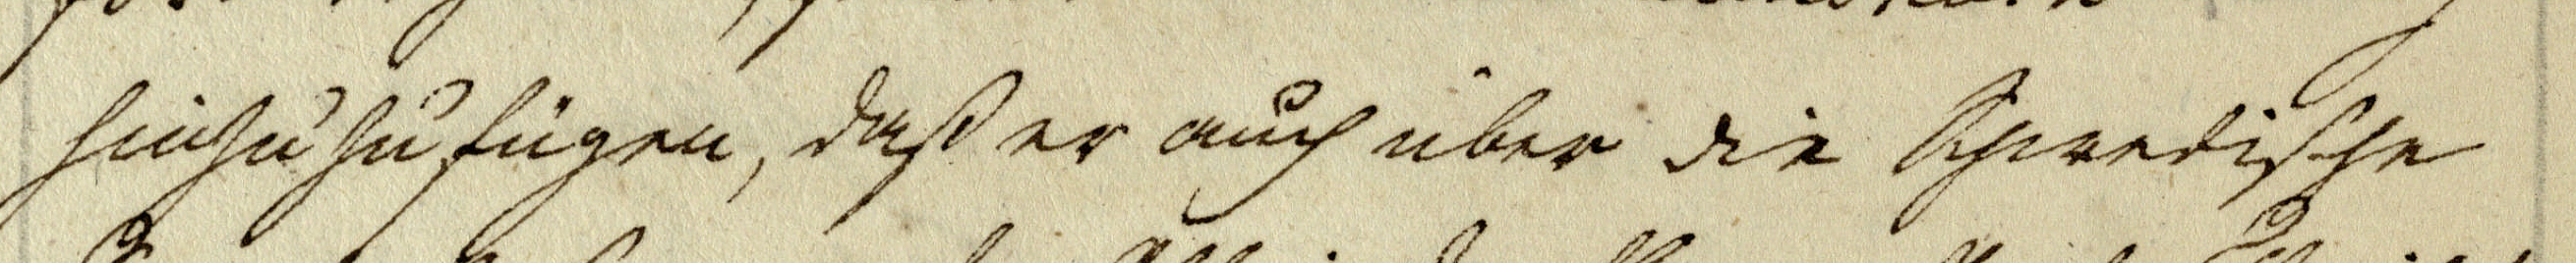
hinzuzufügen, daß er auch über die Schwedische
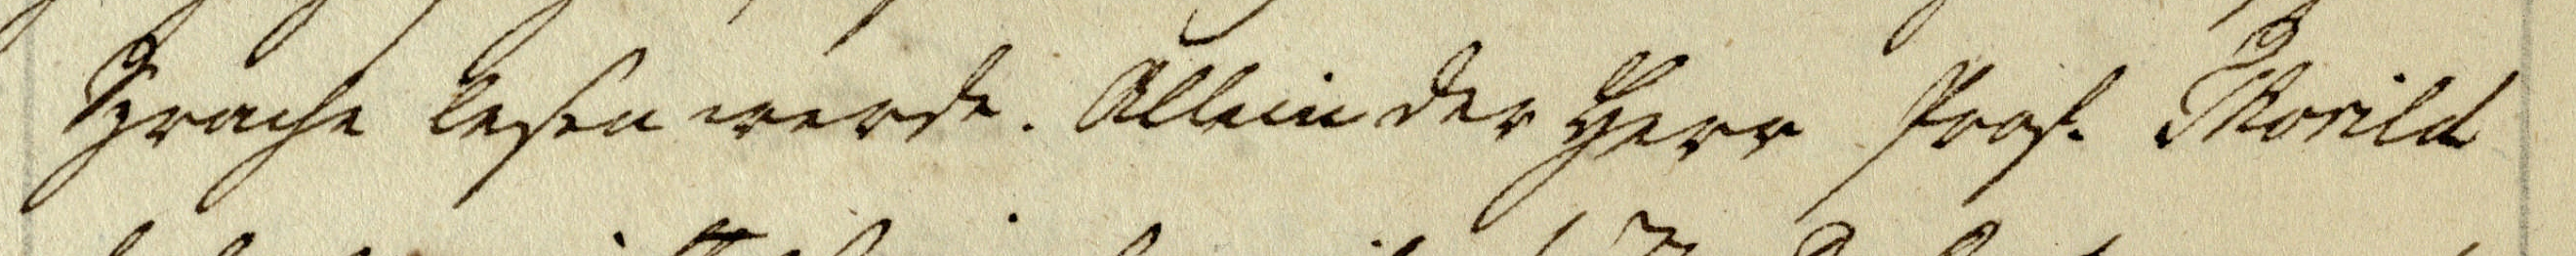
Sprache lesen werde. Allein der Herr Prof. Thorild
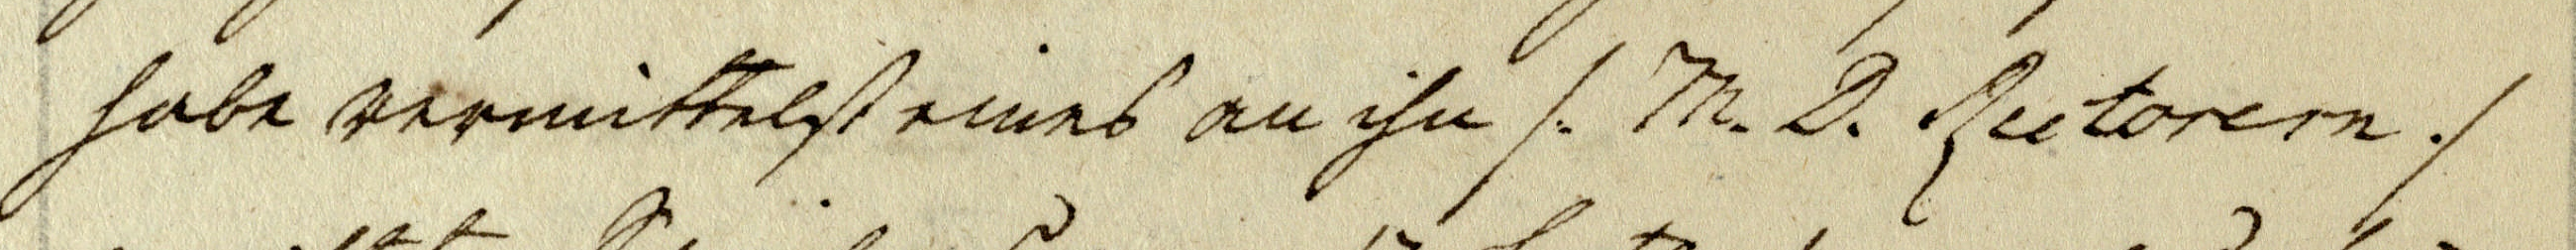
habe vermittelst eines an ihn /. M. D. Rectorem ./
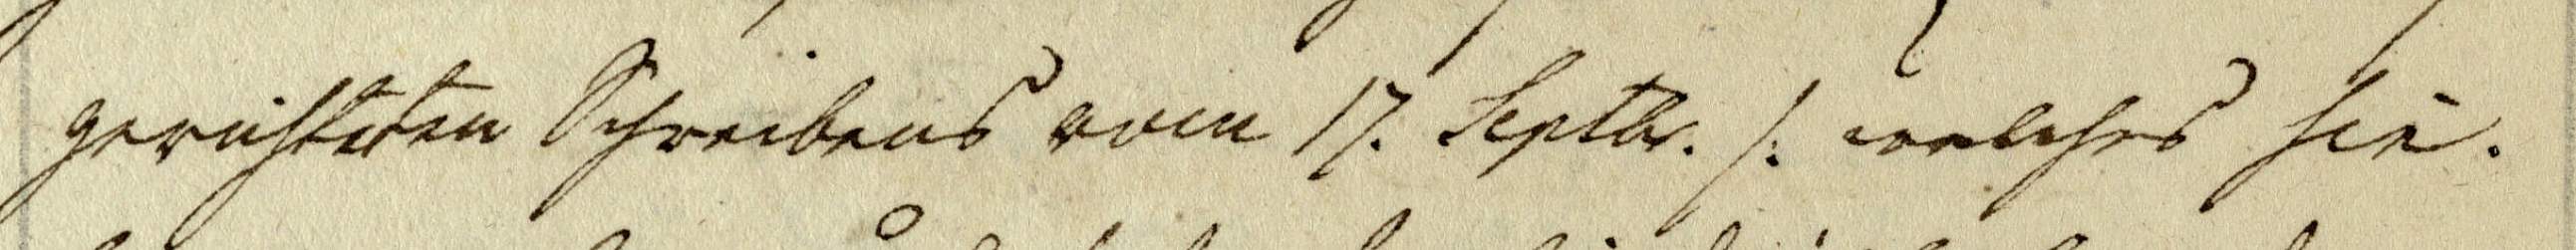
gerichteten Schreibens vom 17. Septbr. /. welches hie¬
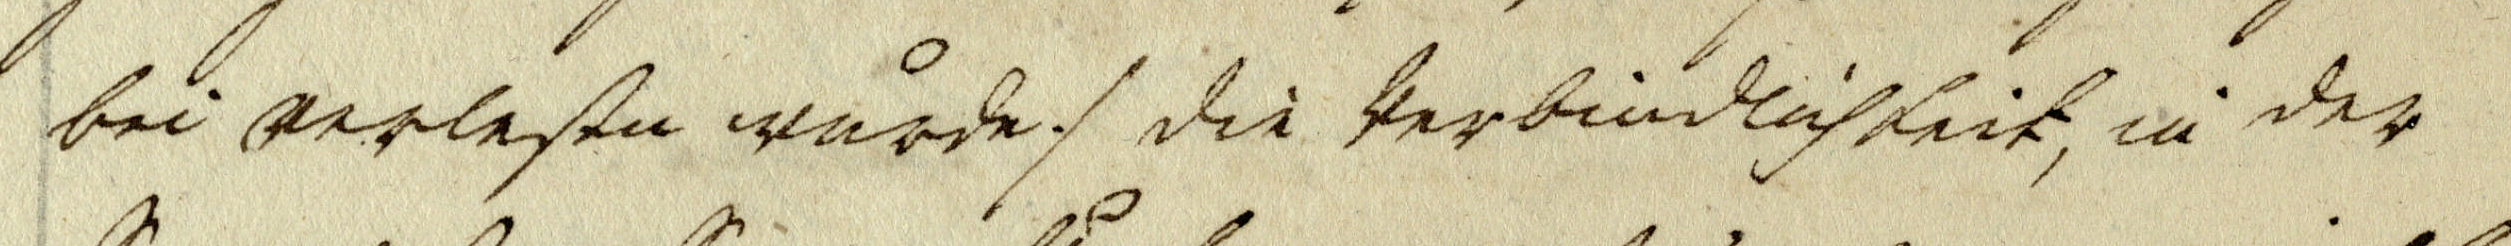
bei verlesen wurde ./ die Verbindlichkeit, in der
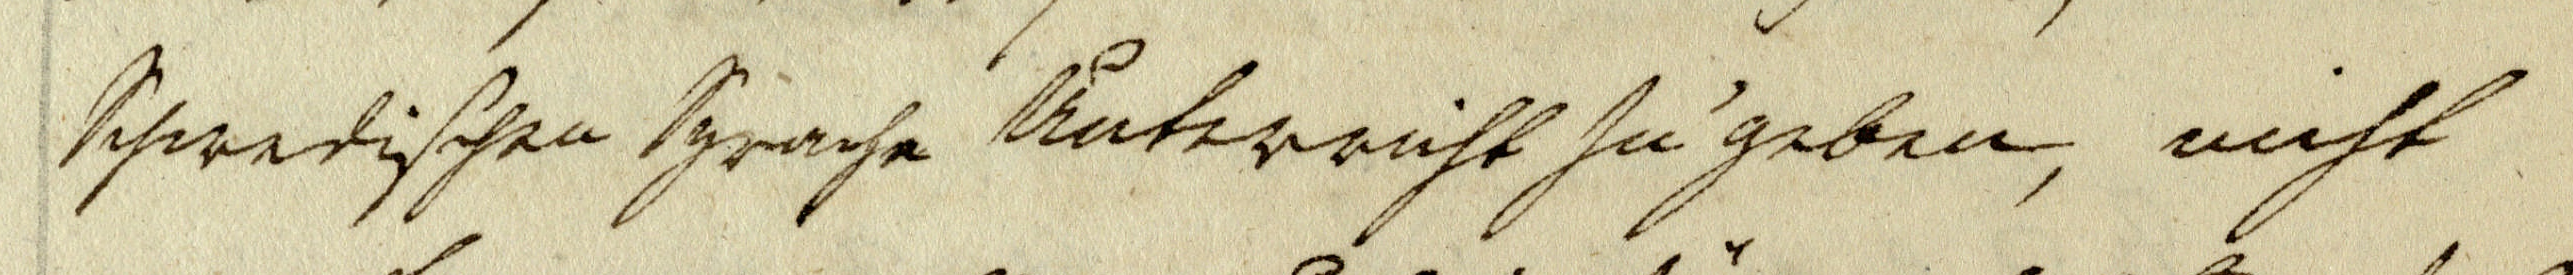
Schwedischen Sprache Unterricht zu geben, nicht
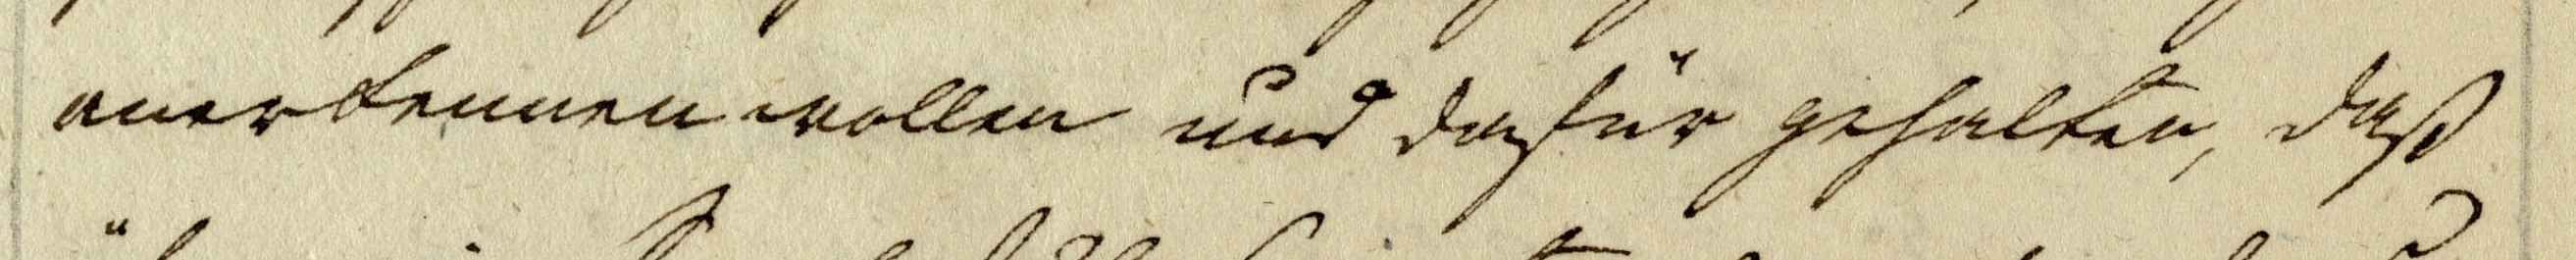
anerkennen wollen und dafür gehalten, daß
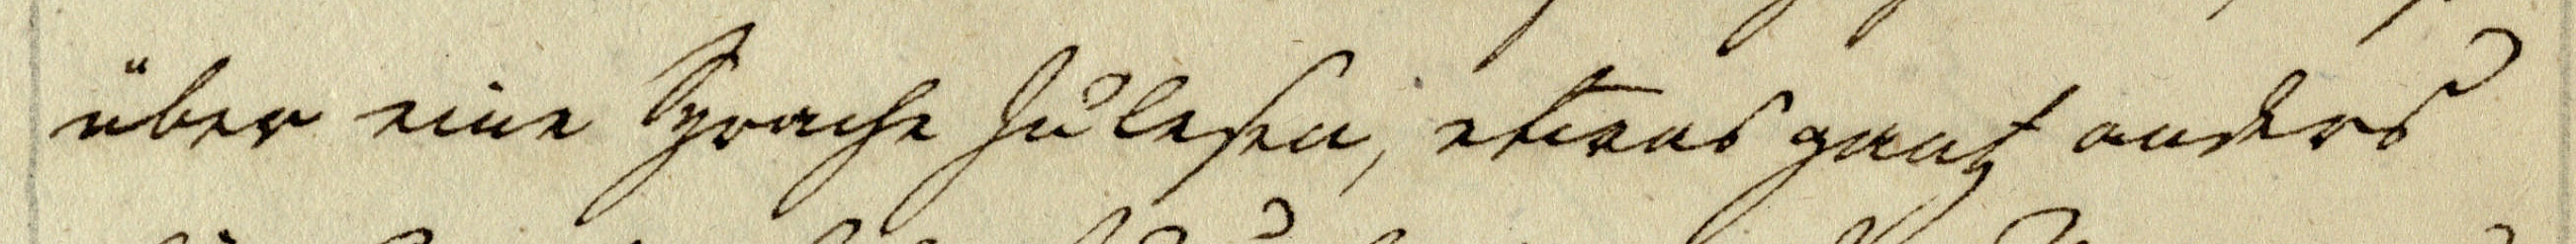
über eine Sprache zu lesen, etwas gantz anders
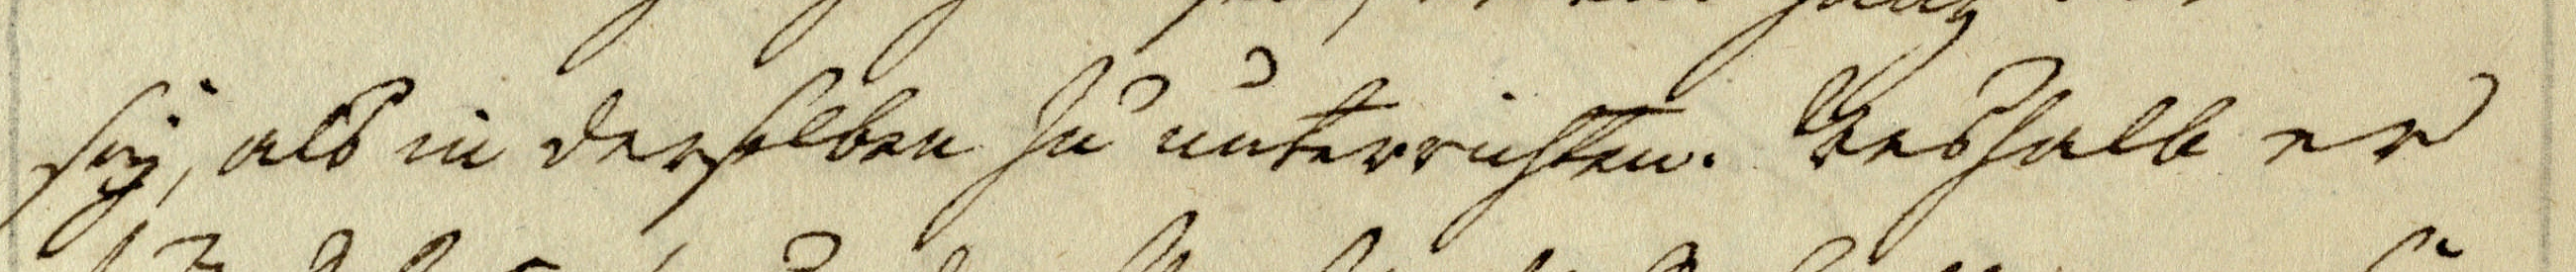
seÿ, als in derselben zu unterrichten. Weshalb er
